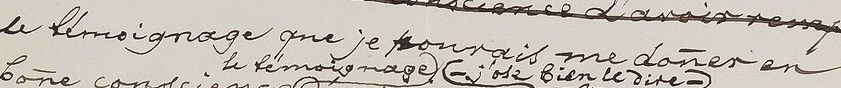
le témoignage que je pouvais me donner en
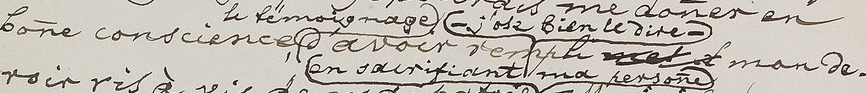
bonne conscience, le témoignage d'avoir rempli mes d. mon de-
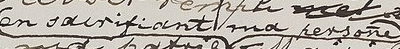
voir vis à vis de ma patrie en sacrifiant –
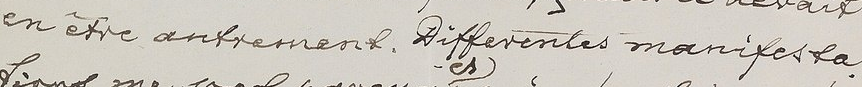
en être autrement. Differentes manifesta-
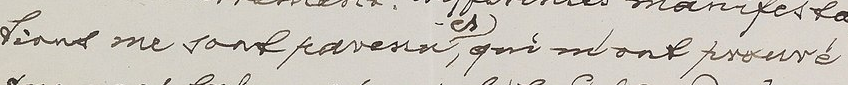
tions me sont pa[r]venues, qui m'ont prouvé
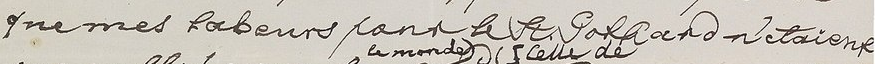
que mes labeurs pour le St. Gothard n'étaient
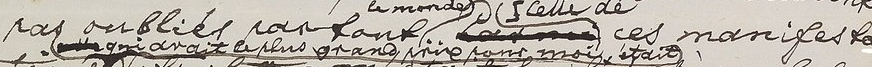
pas oubliés par tout le monde. ParmiCelle de ces manifesta-
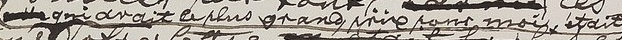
tions celle qui avait le plus grand prix pour moi, était
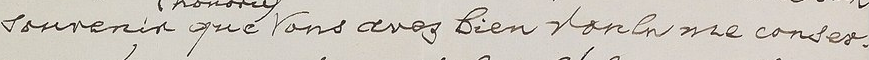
souvenir que Vous avez bien voulu me conser-
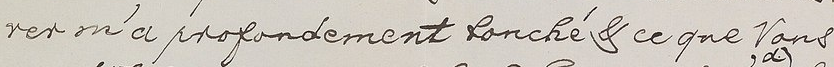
ver m'a profondement touché & ce que Vous
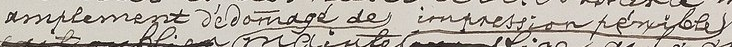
amplement dédommagé de mainte injustice à la quelle
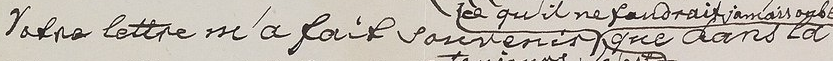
Votre lettre m'a fait souvenir ce qu'il ne faudrait jamais
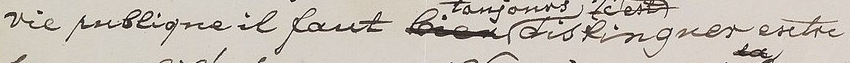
vie publique il faut bientoujours distinguer entre
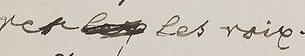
rer le...les voix.
